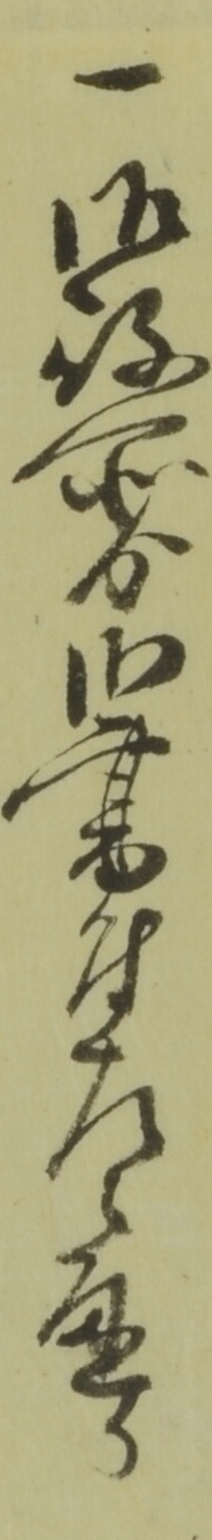一御役所ゟ御書付左之通り
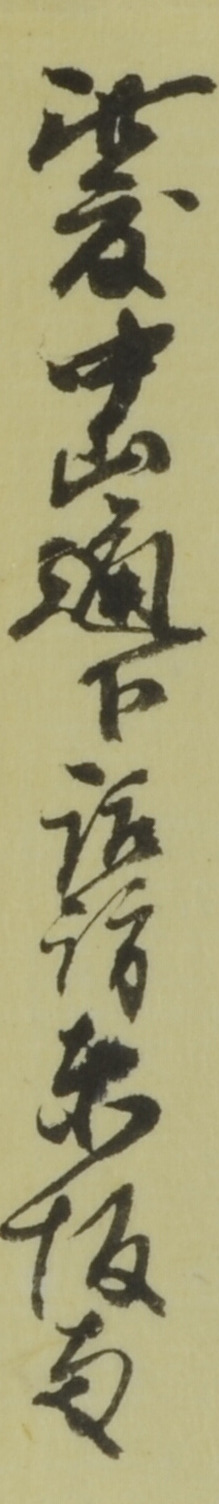此度中山道下諏訪東坂南
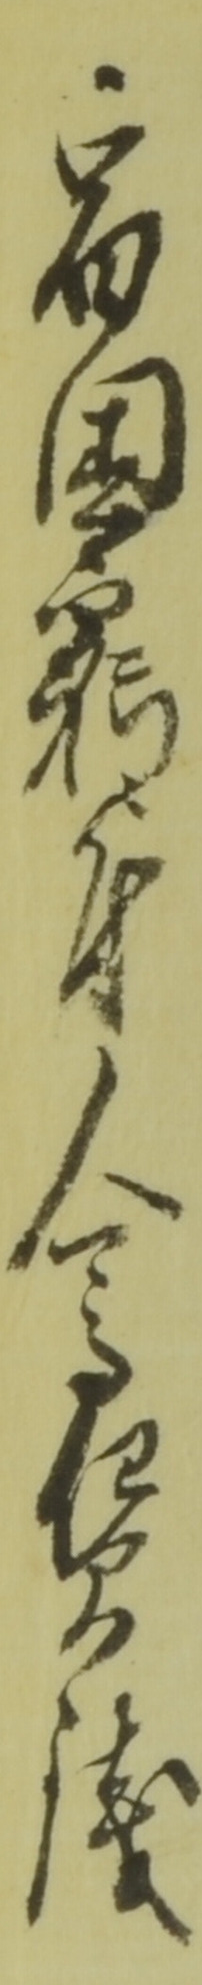宿困窮ニ付人馬賃銭
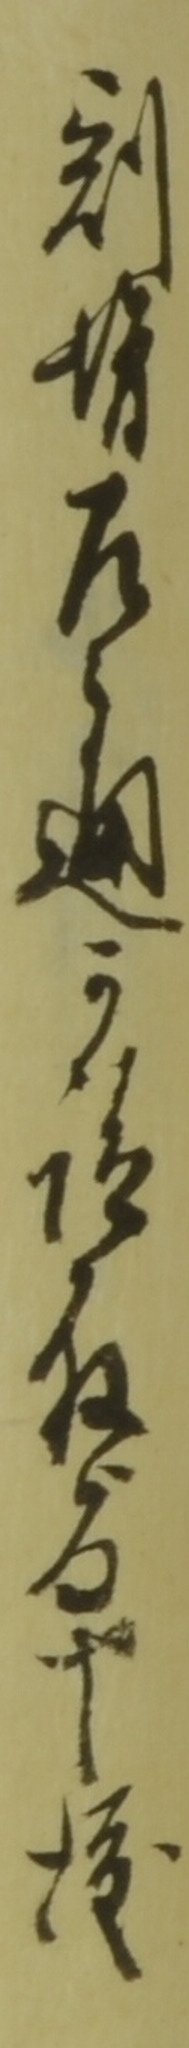割増左之通可請取旨申渡
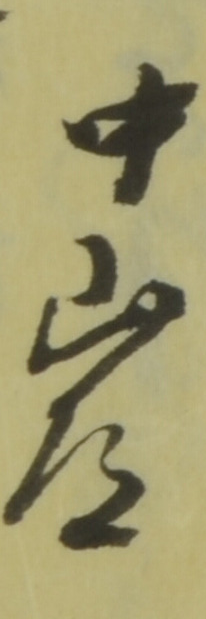中山道

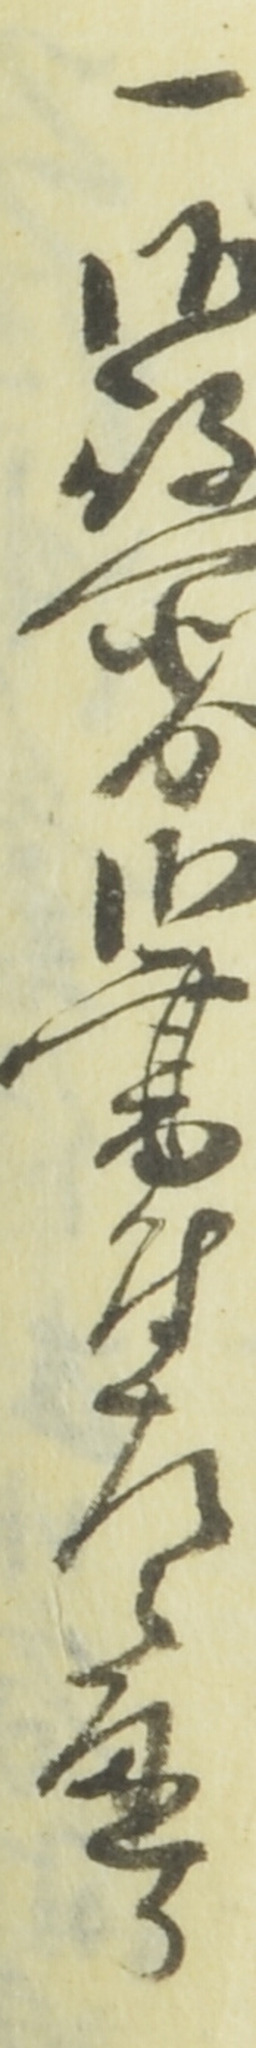一御役所ゟ御書付左之通り
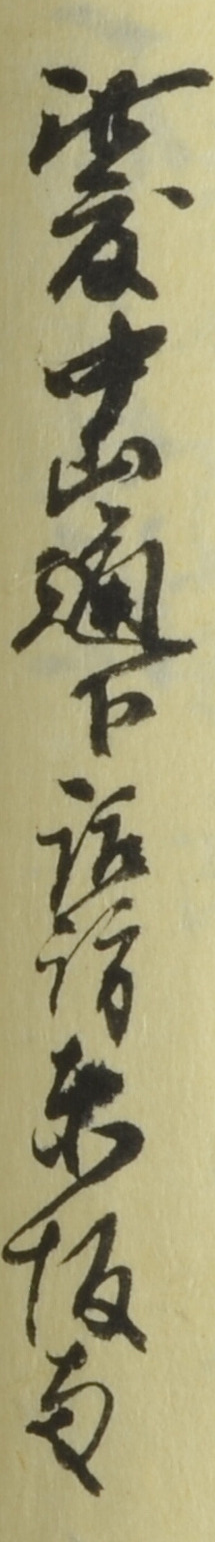此度中山道下諏訪東坂南
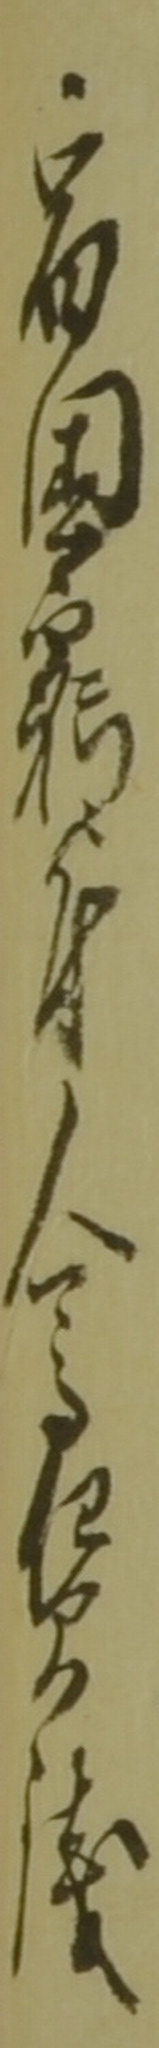宿困窮ニ付人馬賃銭
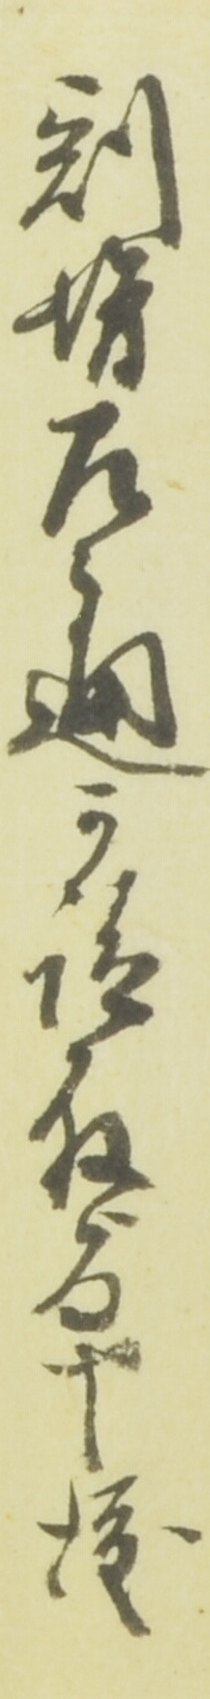割増左之通可請取旨申渡
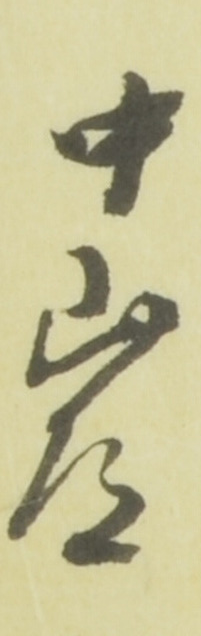中山道
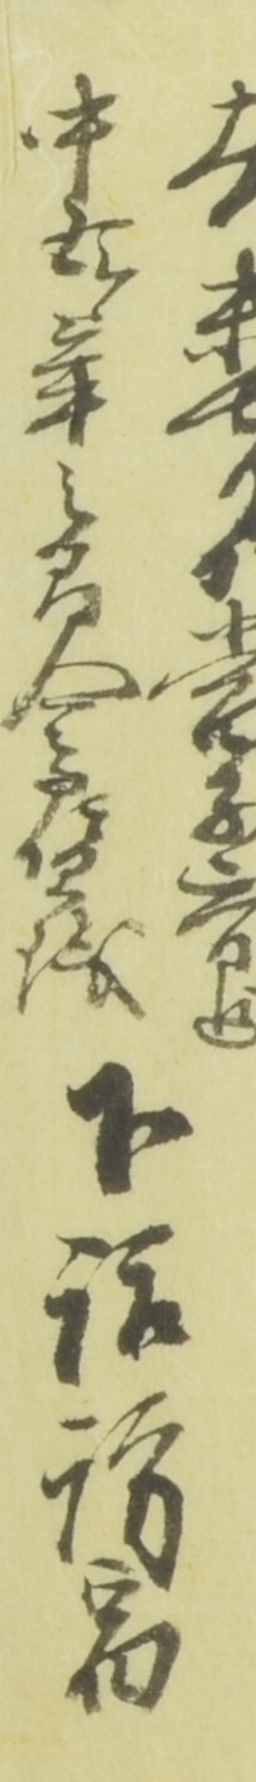中五ヶ年之間人馬賃銭下諏訪宿
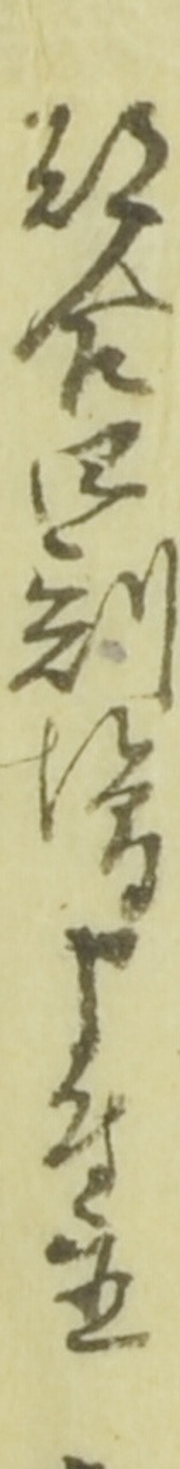都合四割増申付置
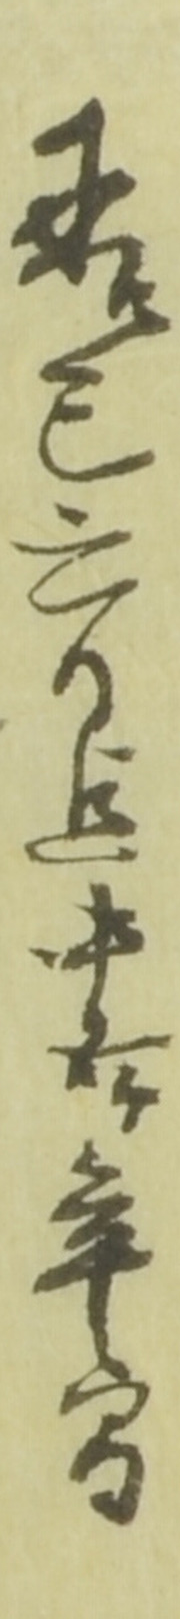来ル巳六月迄中五ヶ年間
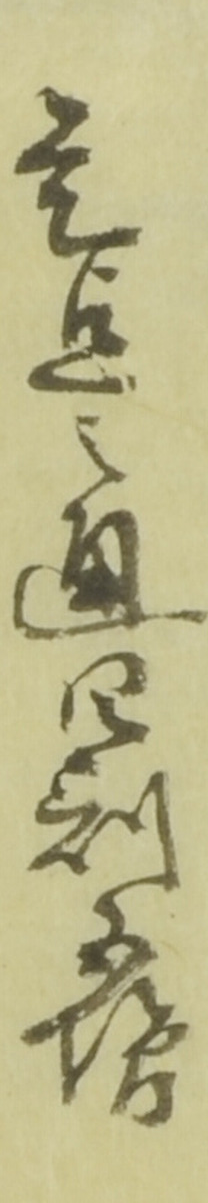是迄之通四割五増
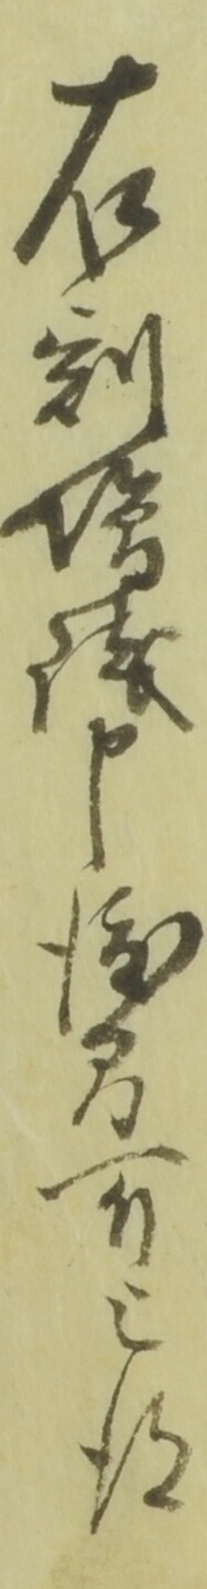右割増銭申渡間可被得
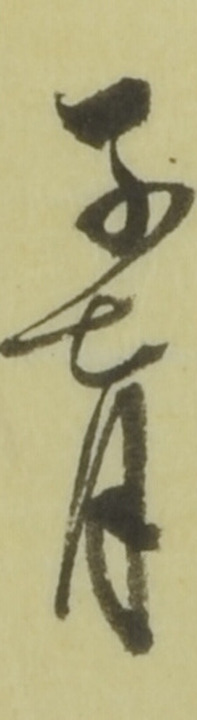子七月
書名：御触書御書附控
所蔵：伊那市立高遠町図書館・合同会社AMANE
